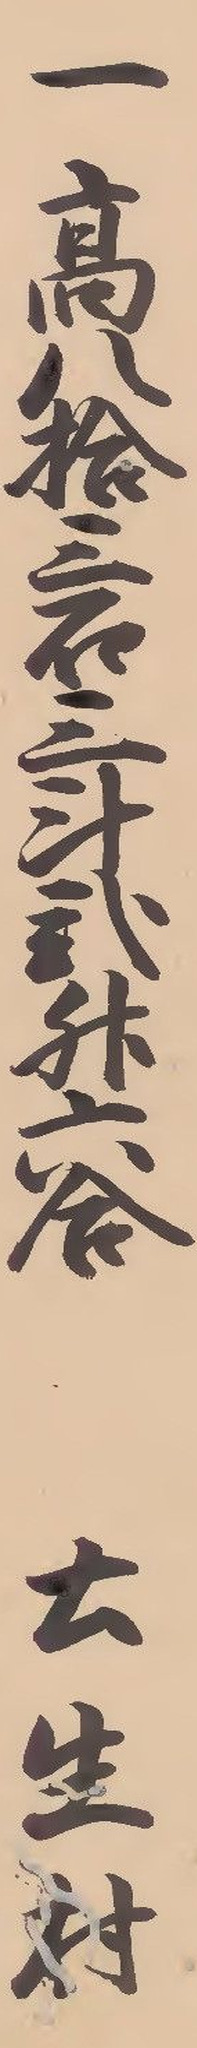一高八拾三石三斗弐升六合土生村
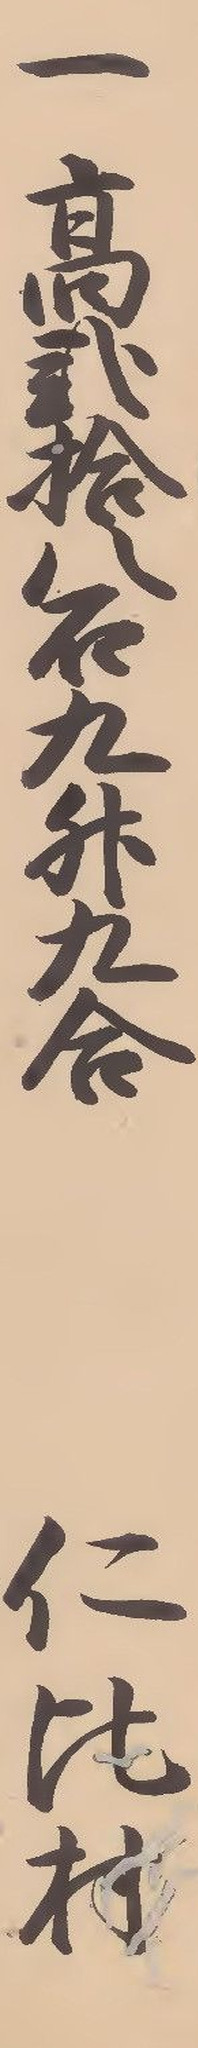一高弐拾八石九升九合仁比村
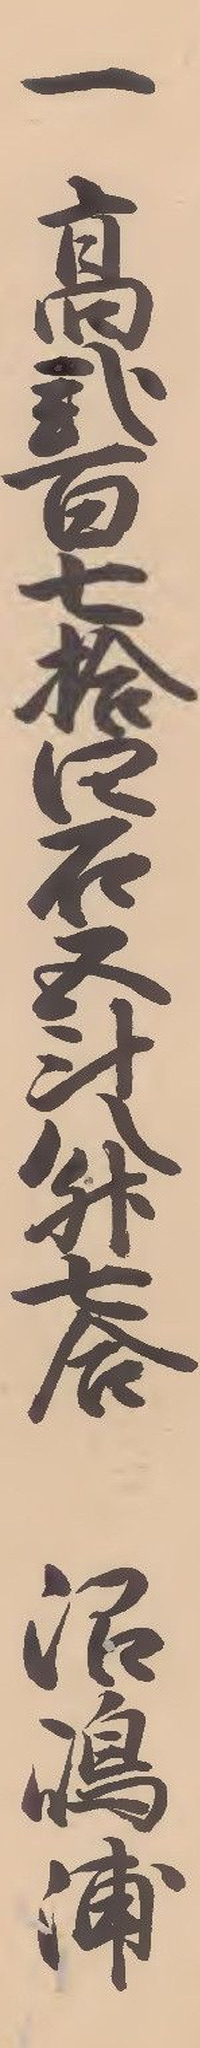一高弐百七拾四石五斗八升七合沼島浦
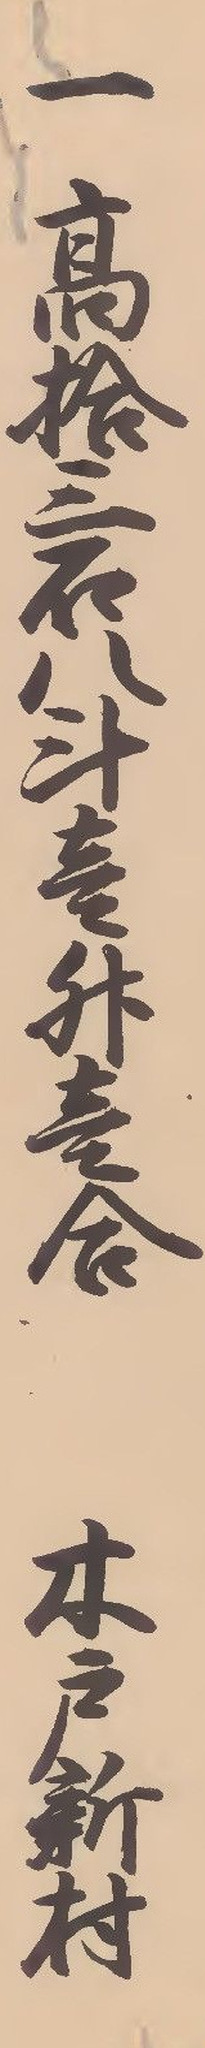一高拾三石八斗壱升壱合木戸新村
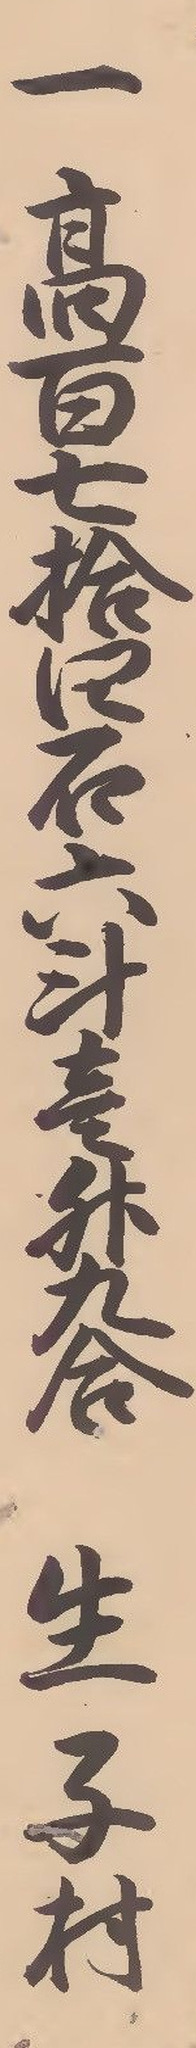一高百七拾四石六斗壱升九合生子村

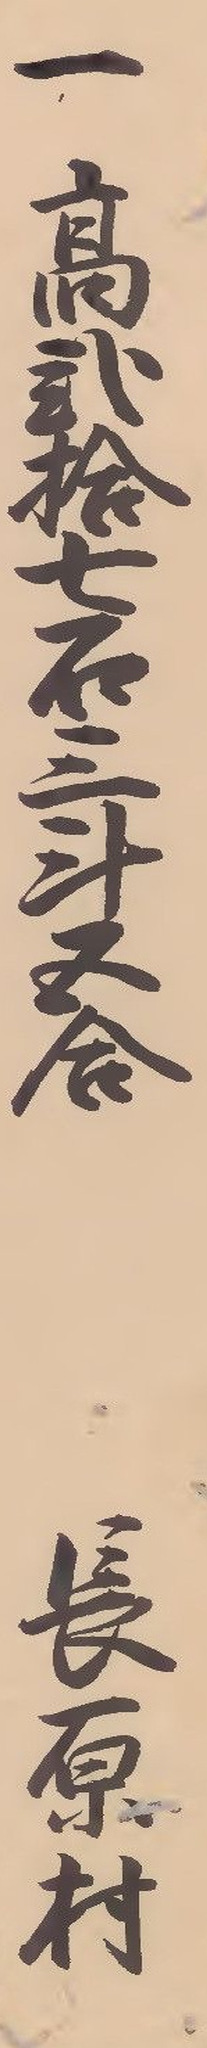一高弐拾七石三斗五升長原村
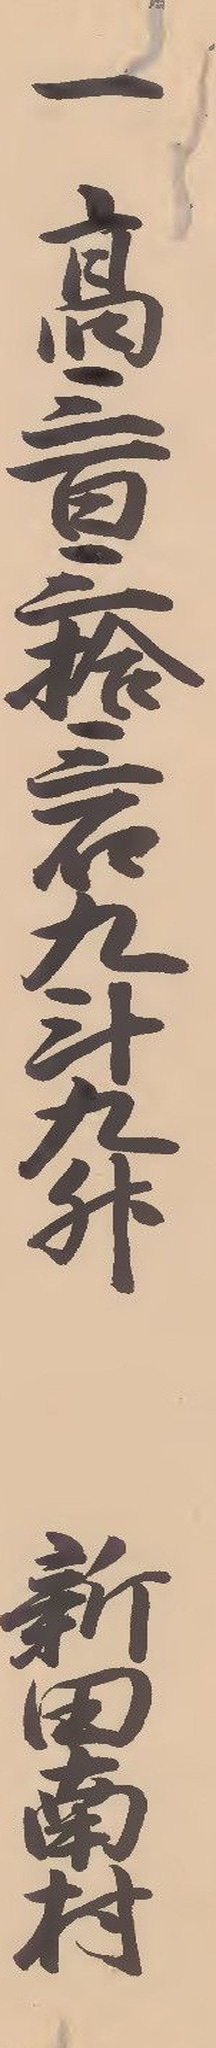一高三百三拾三石九斗九升新田南村
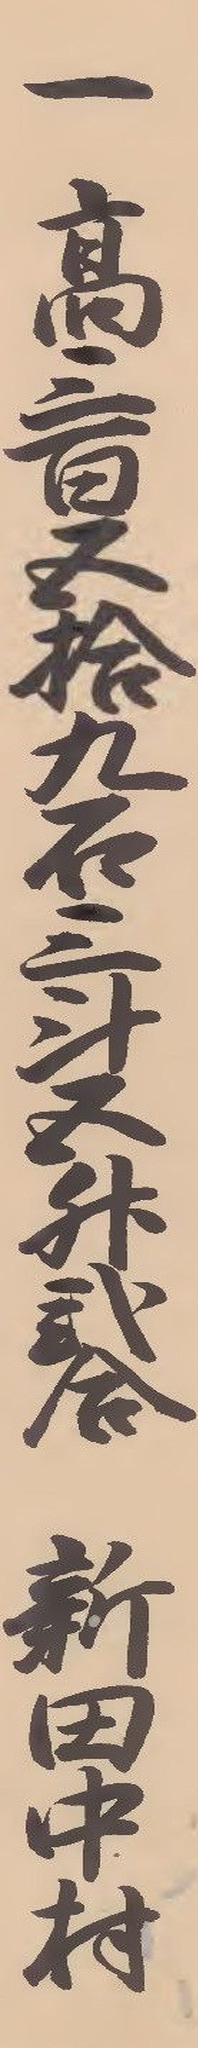一高三百五拾九石三斗五升弐合新田中村
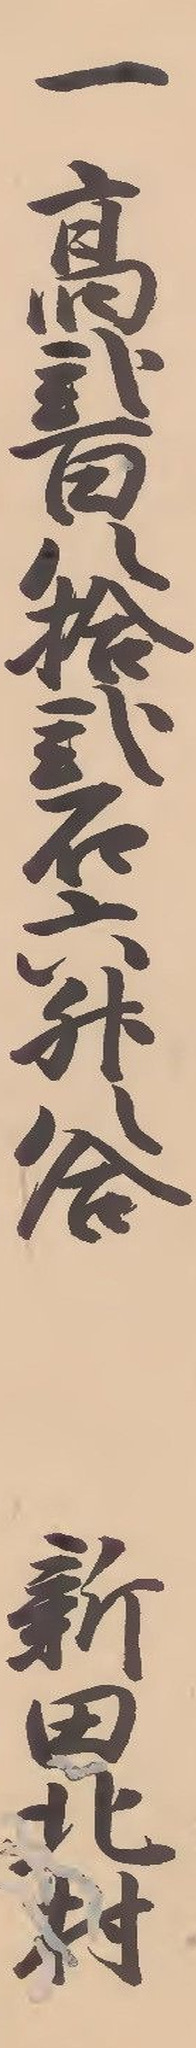一高弐百八拾弐石六升八合新田北村
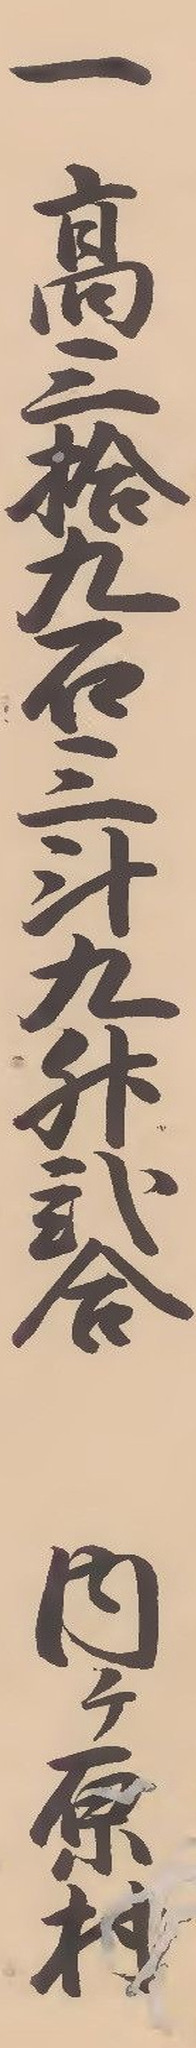一高三拾九石三斗九升弐合内ヶ原村
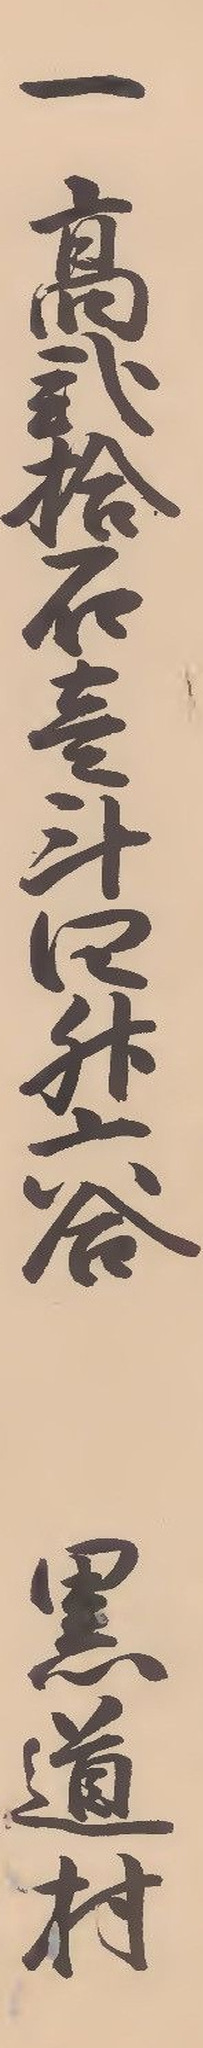一高弐拾石壱斗四升六合黒道村
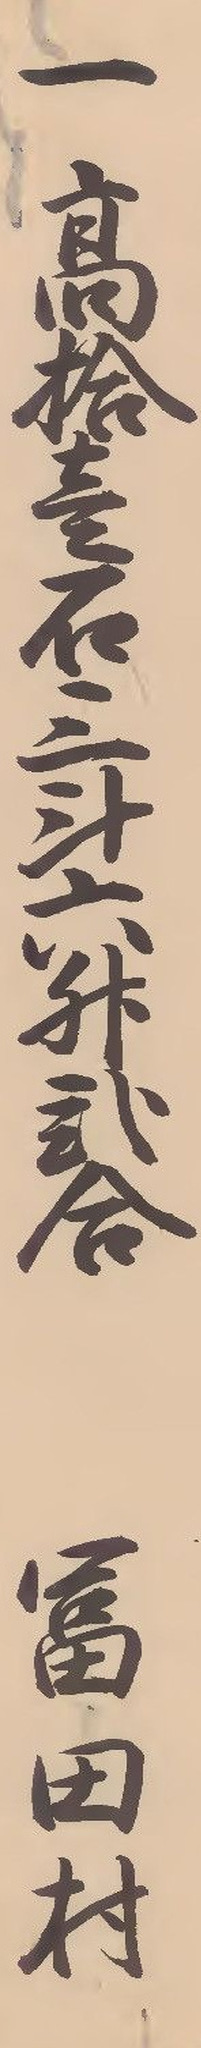一高拾壱石三斗六升弐合富田村
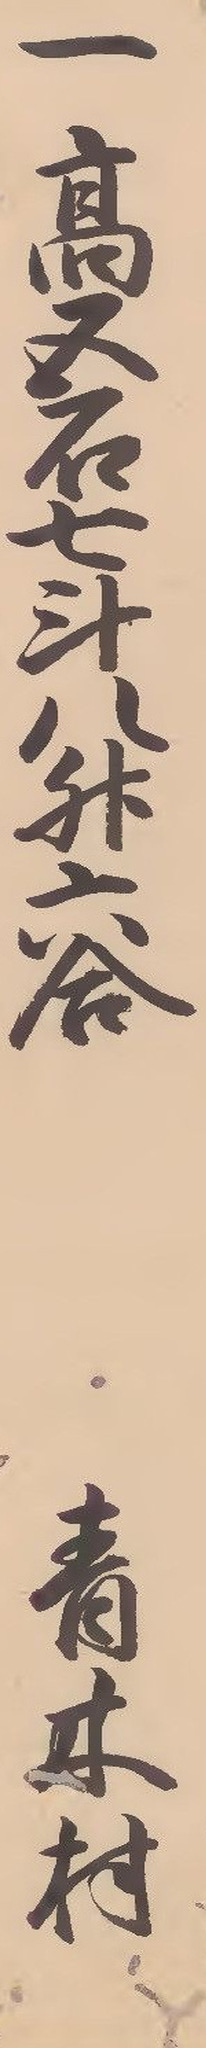一高五石七斗八升六合青木村

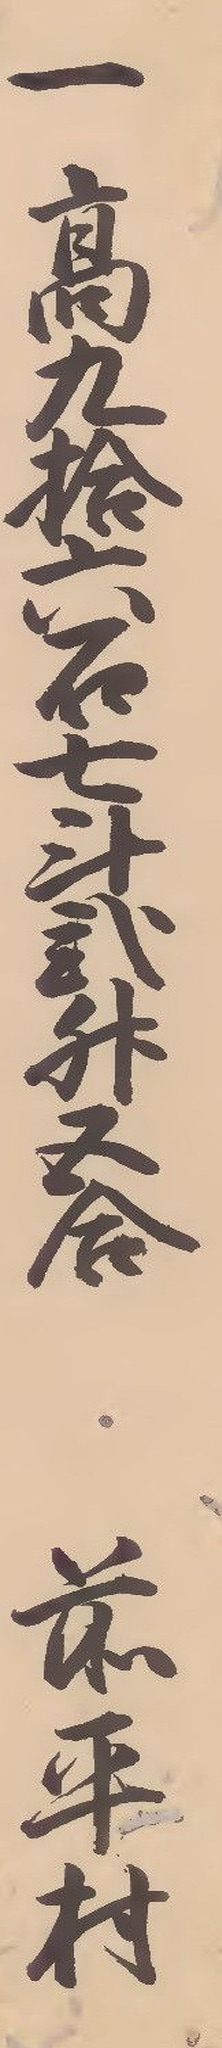一高九拾六石七斗弐升五合前平村
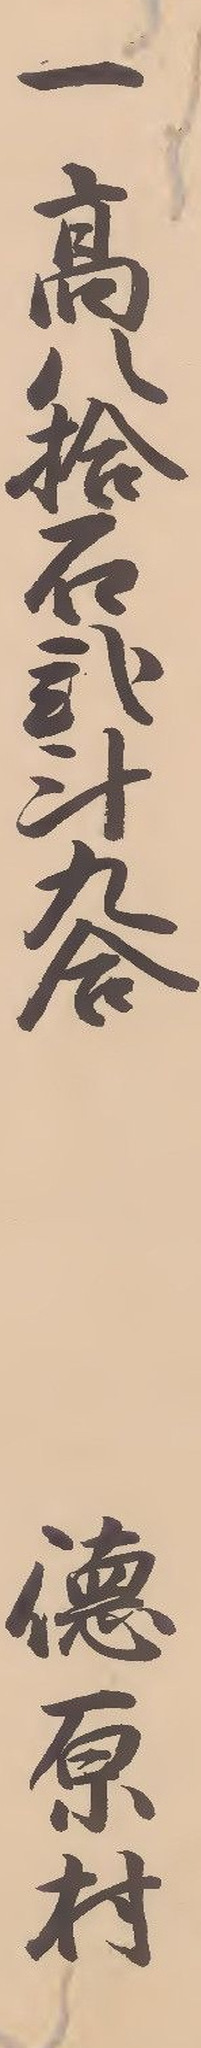一高八拾石弐斗九合徳原村
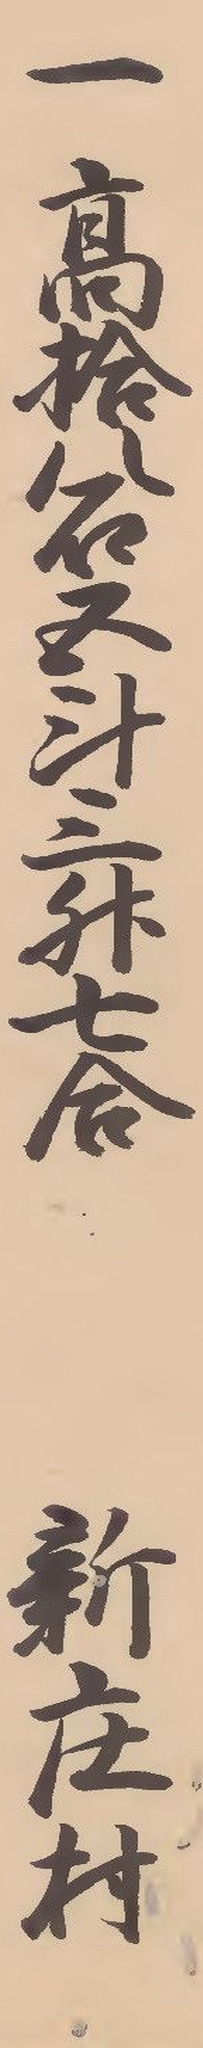一高拾八石五斗三升七合新庄村
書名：淡路国郷帳
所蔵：国立公文書館 National Archives of Japan
